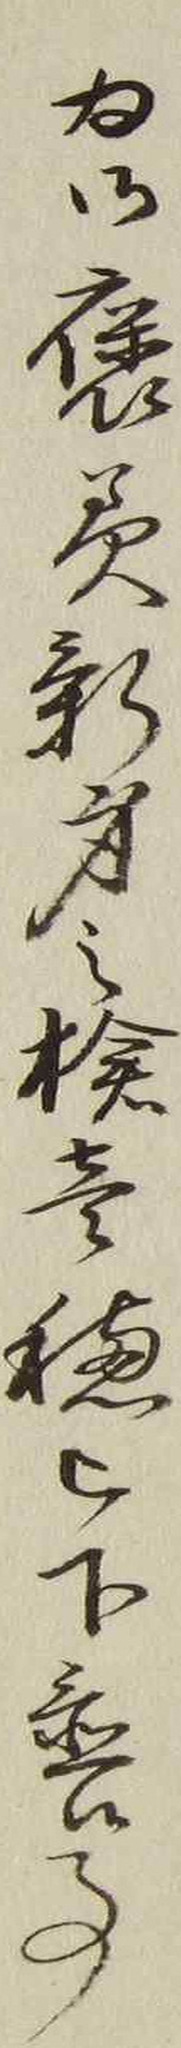ゐ御褒美新身之鎗壱穂被下置候事
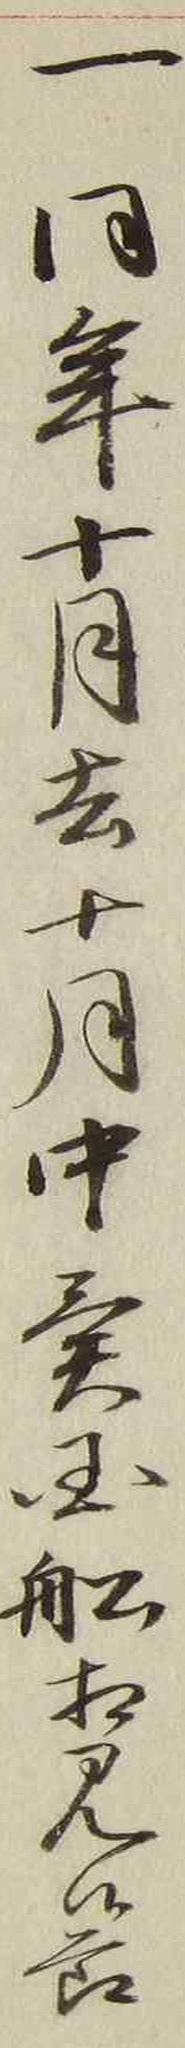一同年十月去十月中異国舩相見候節

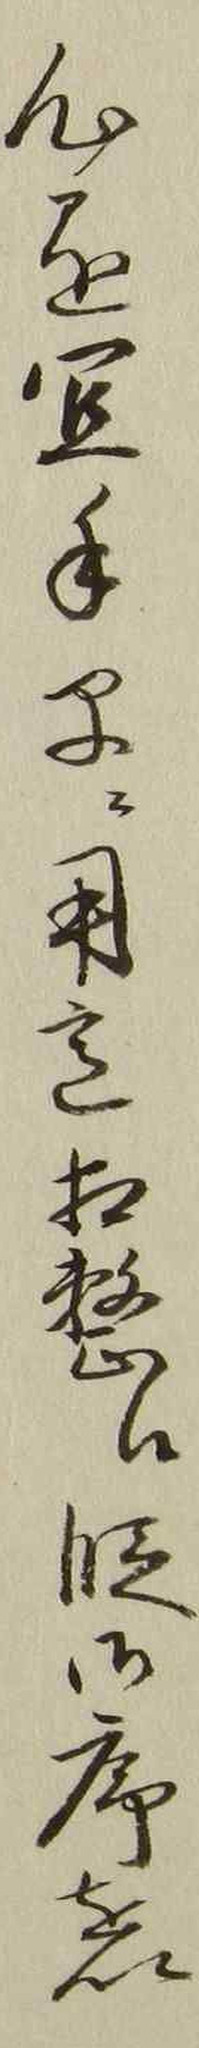心懸宜手早ニ用意相整候段御序を以
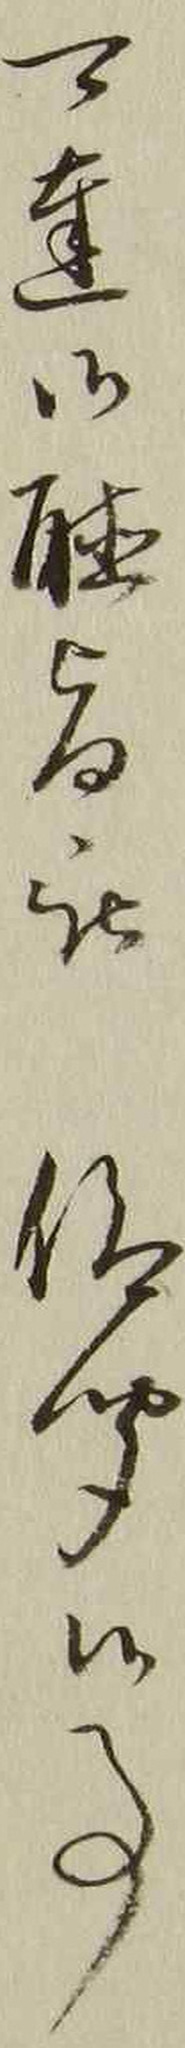可達御聴旨被仰聞候事
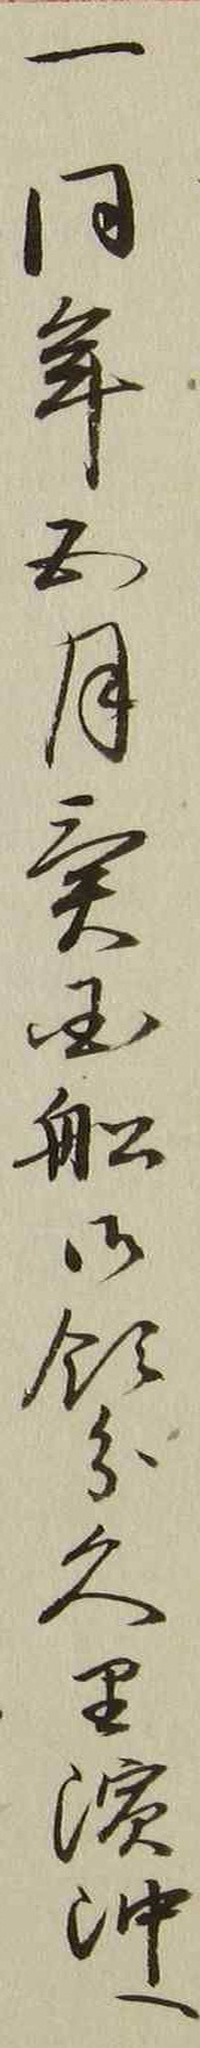一同年五月異国舩御領分久里浜沖へ
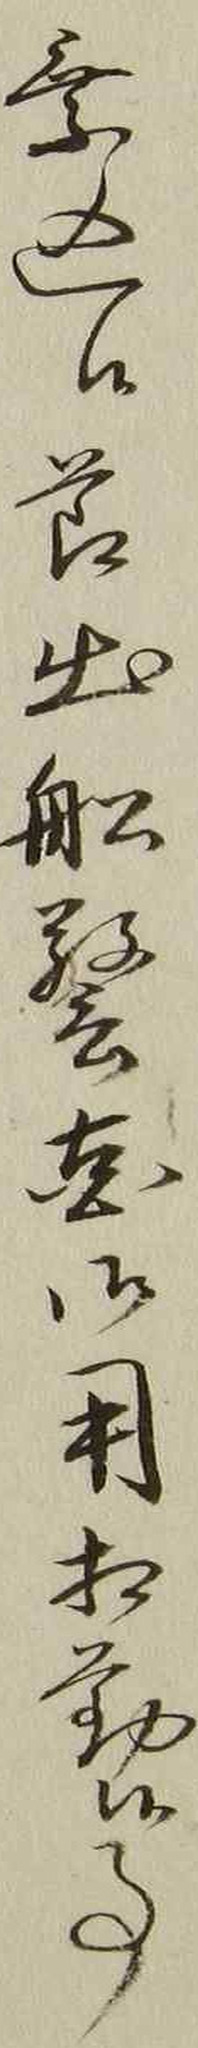乗込候節出舩警固御用相勤候事
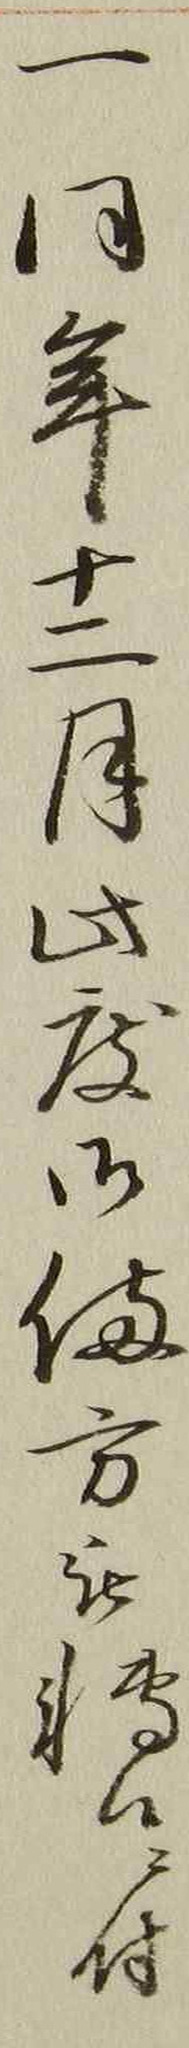一同年十二月此度御備方被転候ニ付
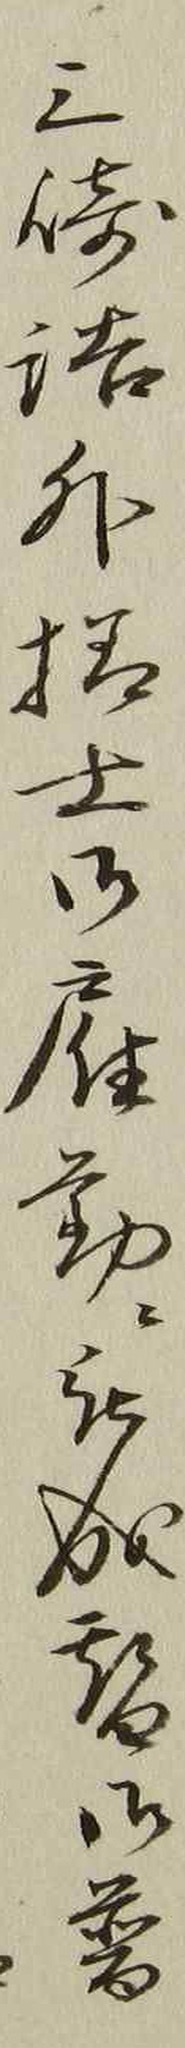三崎詰外様士御雇勤ニ被成替御普
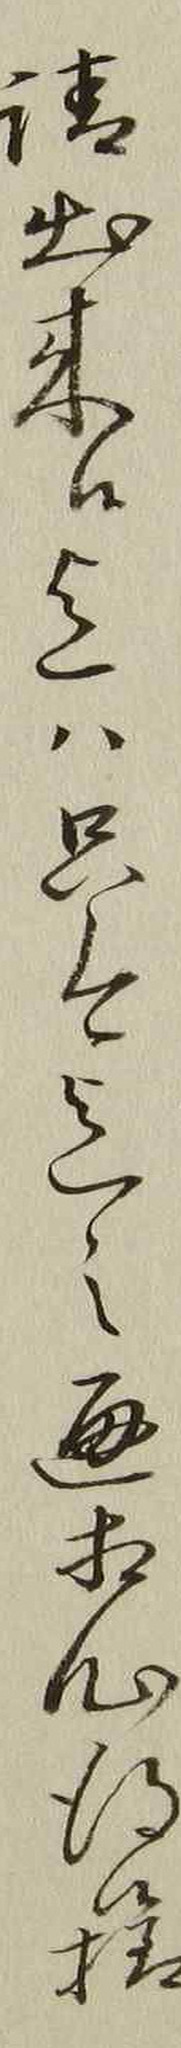請出来候迄ハ只今迄之通相心得候様
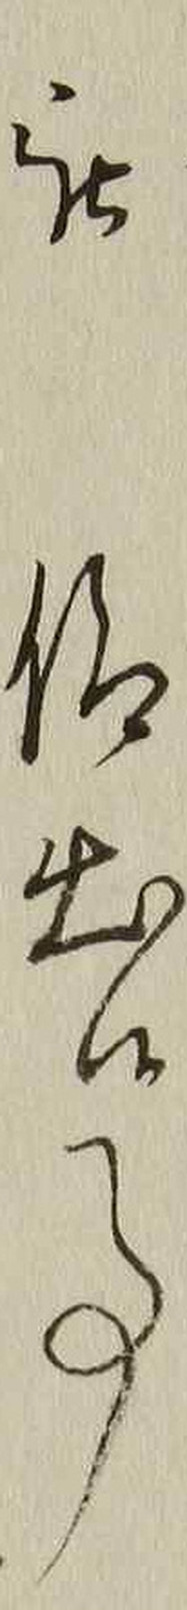被仰出候事
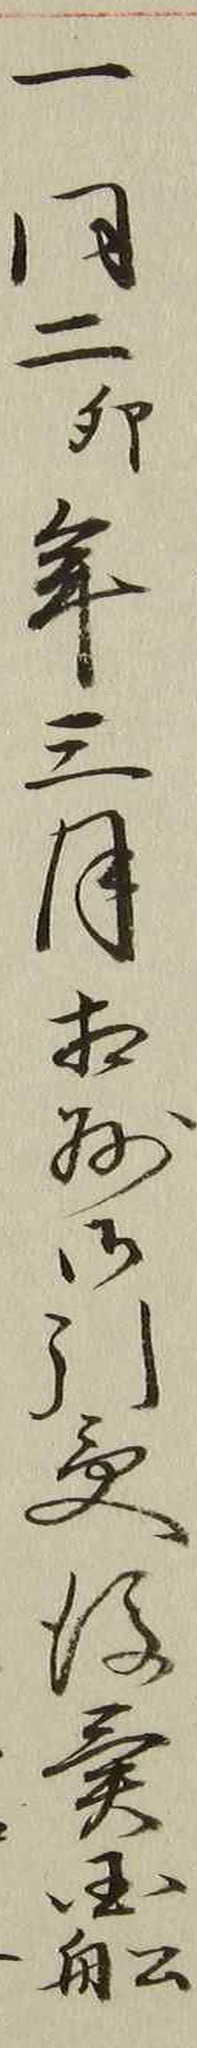一同ニ夘年三月相州御引受後異国舩
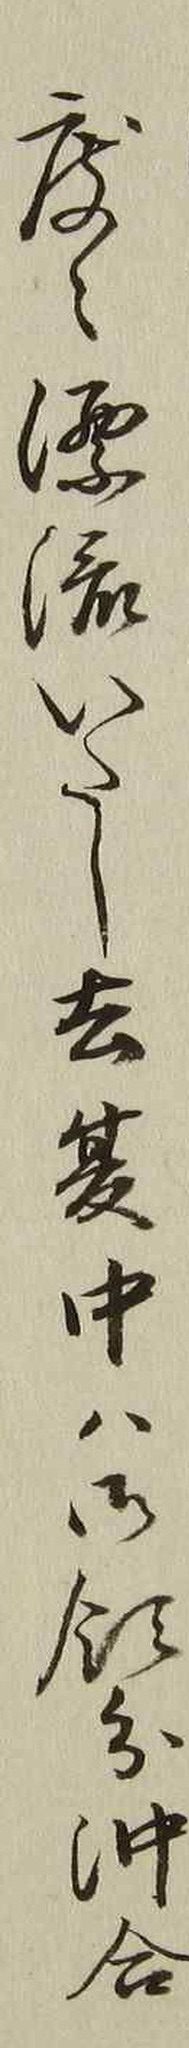度々漂流いたし去夏中ハ御領分沖合
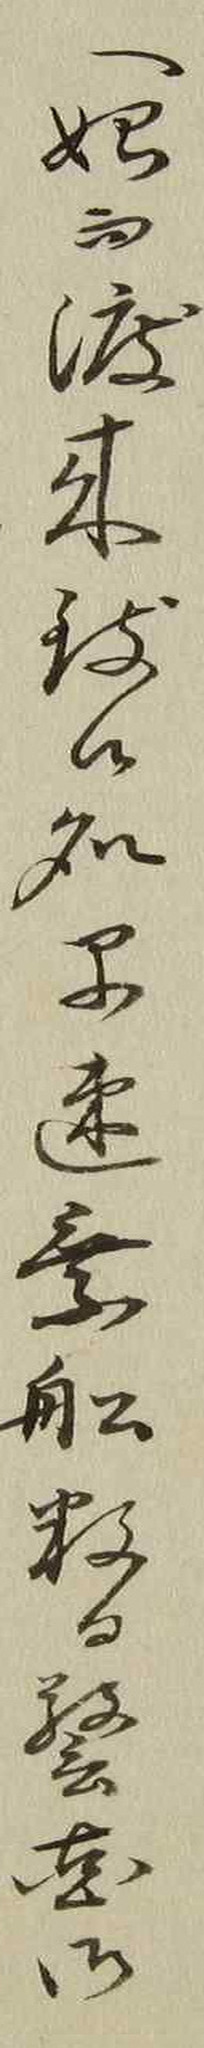へ始而渡来致候処早速乗船数日警固御
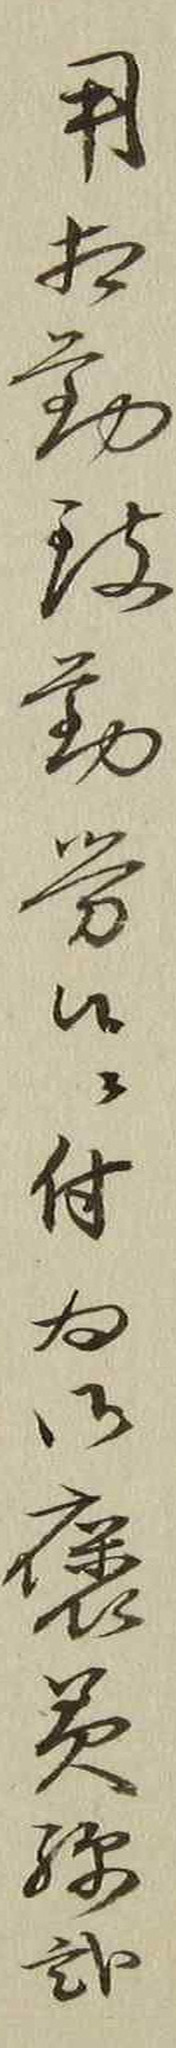用相勤致勤労候ニ付ゐ御褒美綿弐
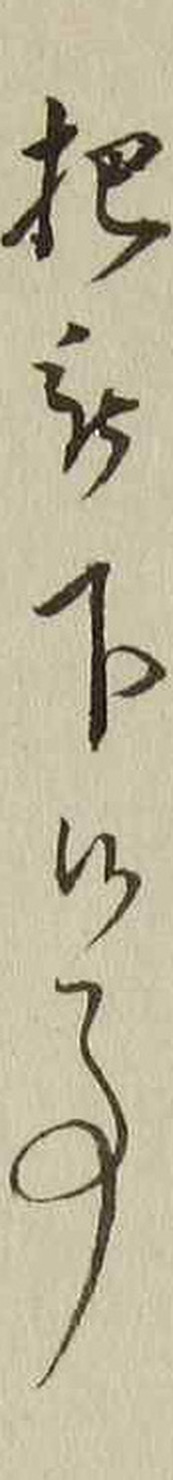把被下候事
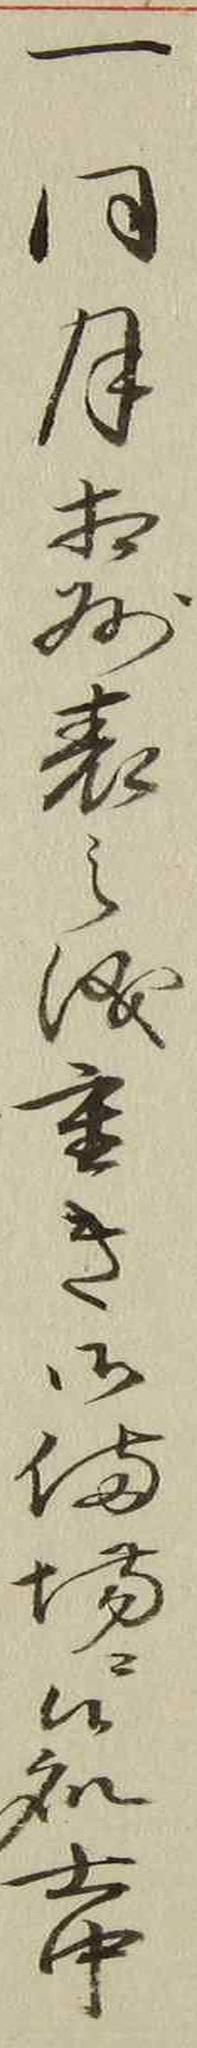一同月相州表之儀重き御備場ニ候処士中
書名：諸士系譜　巻之114　か之部22
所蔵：会津若松市立会津図書館
